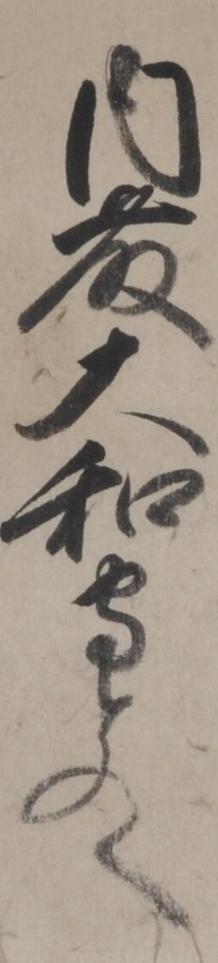内藤大和守とのへ

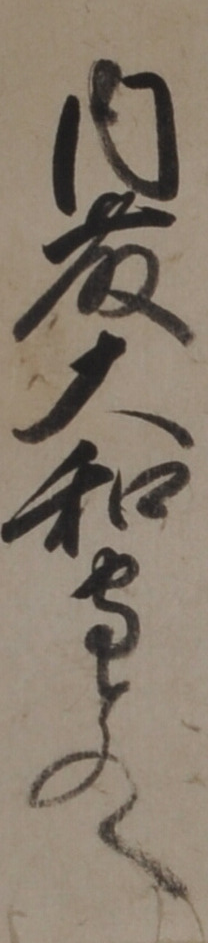内藤大和守とのへ

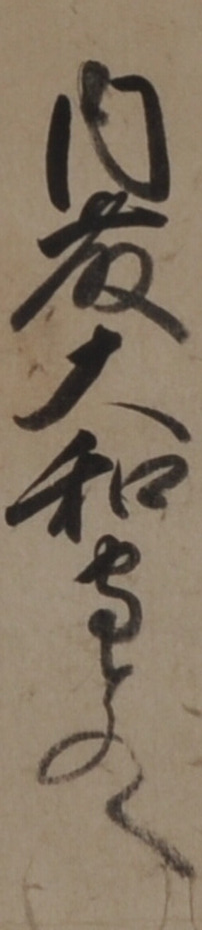内藤大和守とのへ
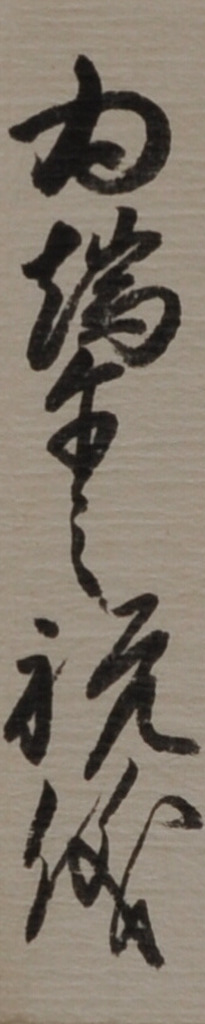為端午之祝儀
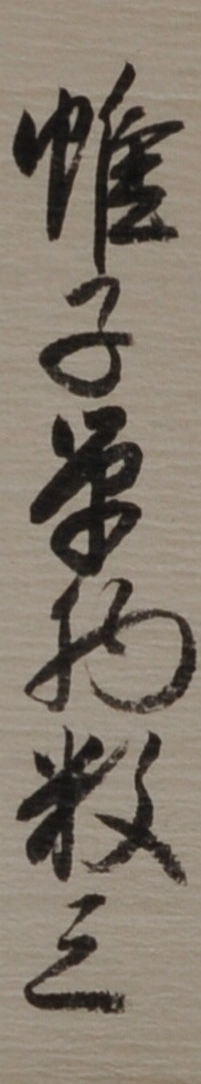帷子単物数三
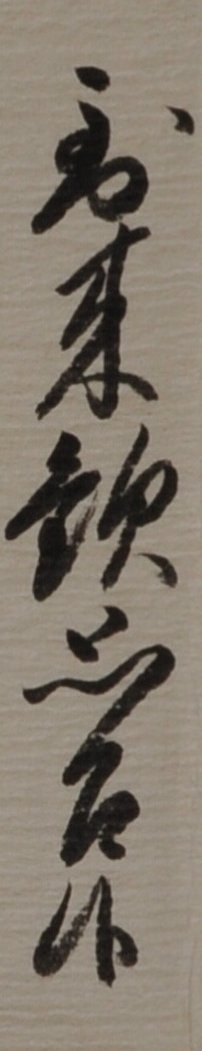到来歓思召候
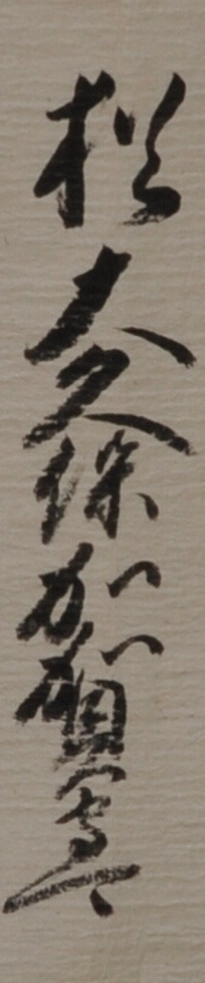猶大久保加賀守可
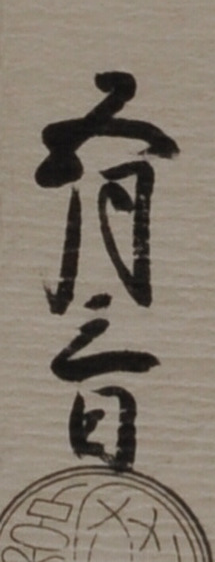五月三日
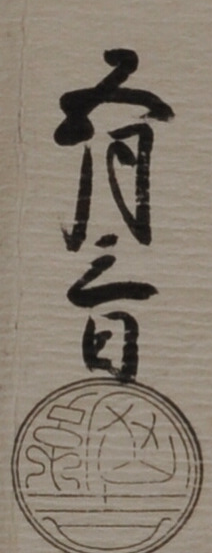五月三日
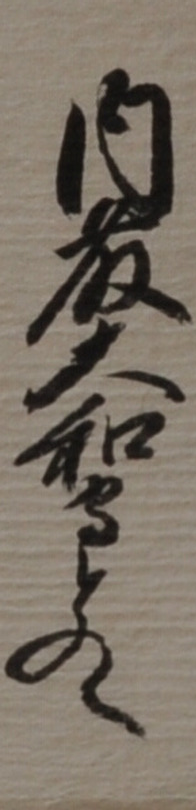内藤大和守とのへ
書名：御内書
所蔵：伊那市立高遠町図書館・合同会社AMANE
